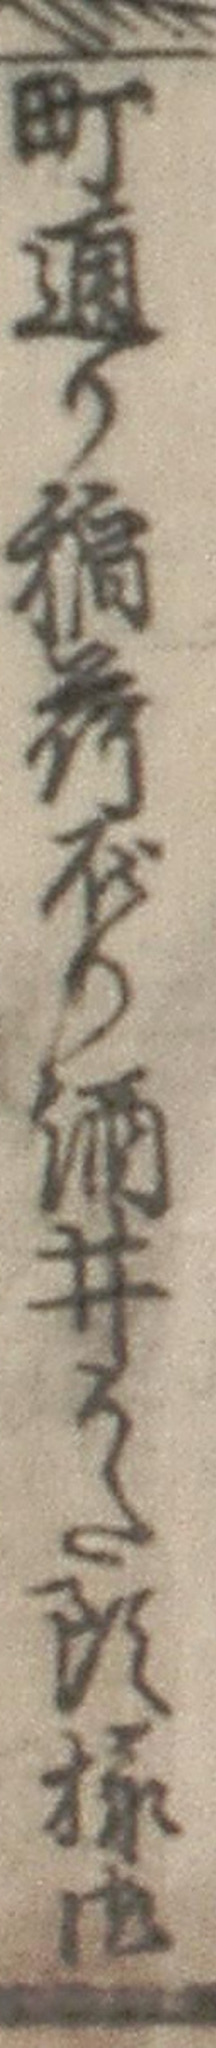町通り稲荷ぼり酒井うた頭様御
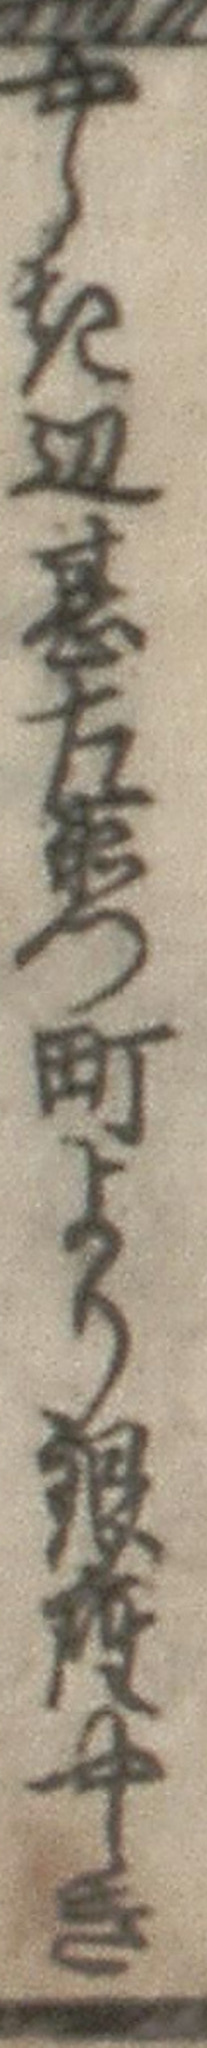やしき辺甚左衛門町より銀座やしき
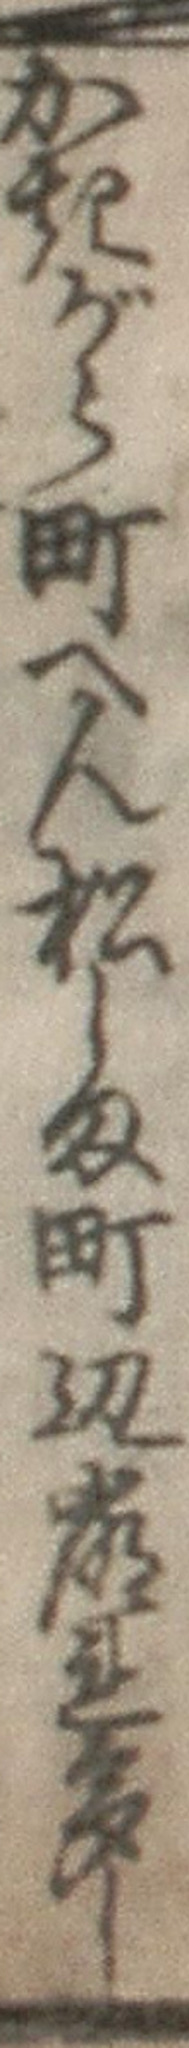かきがら町へん松しま町辺崩れ多し
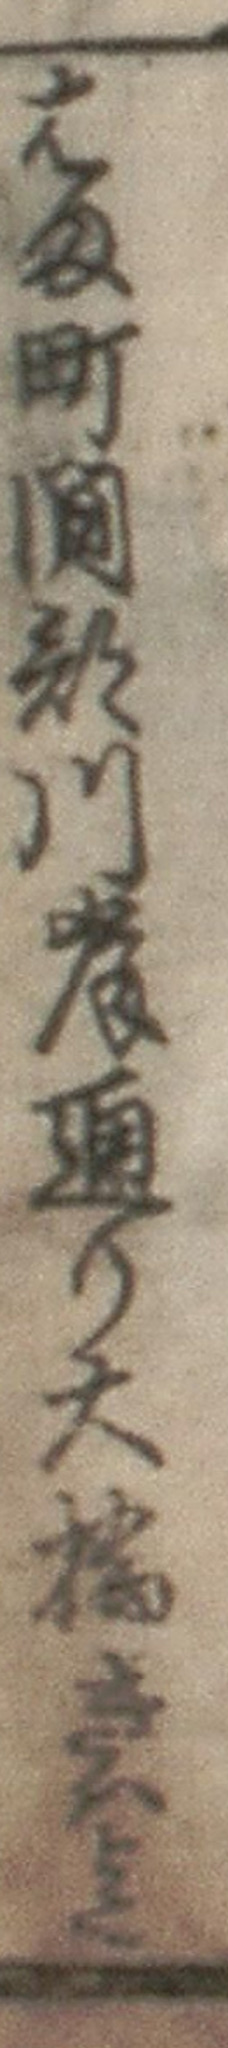はま町間部川岸通り大橋きわ迄

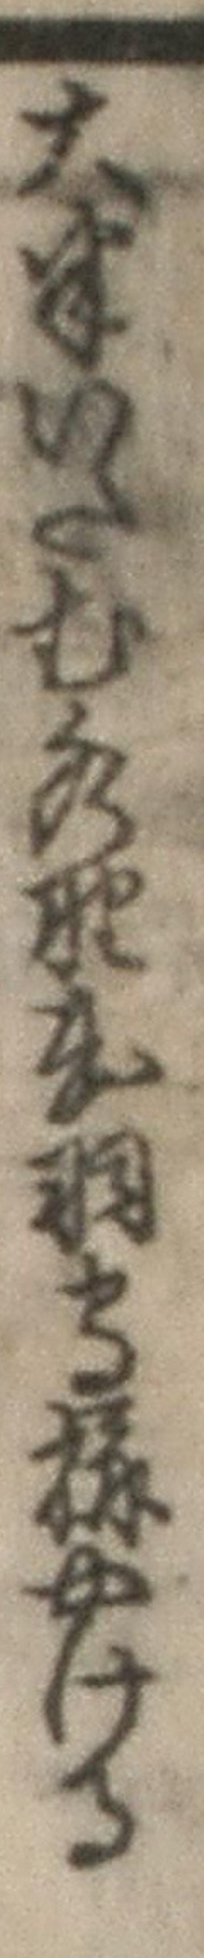大半いたむ水野出羽守様やける
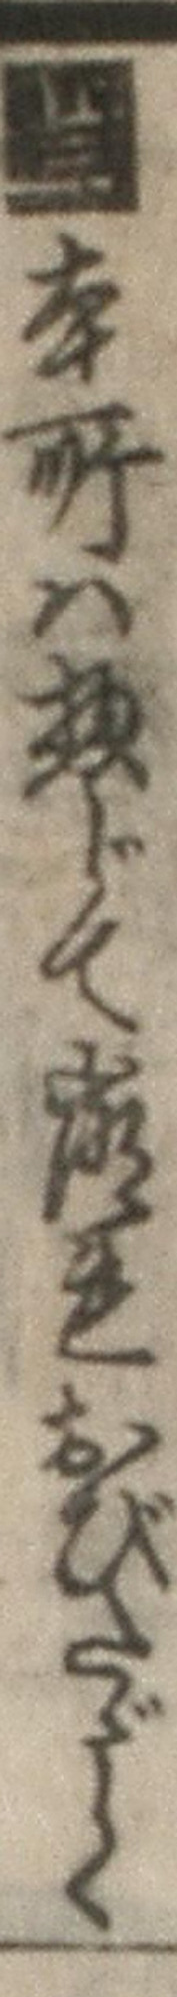廿三本所は惣じて崩れおびたゞしく
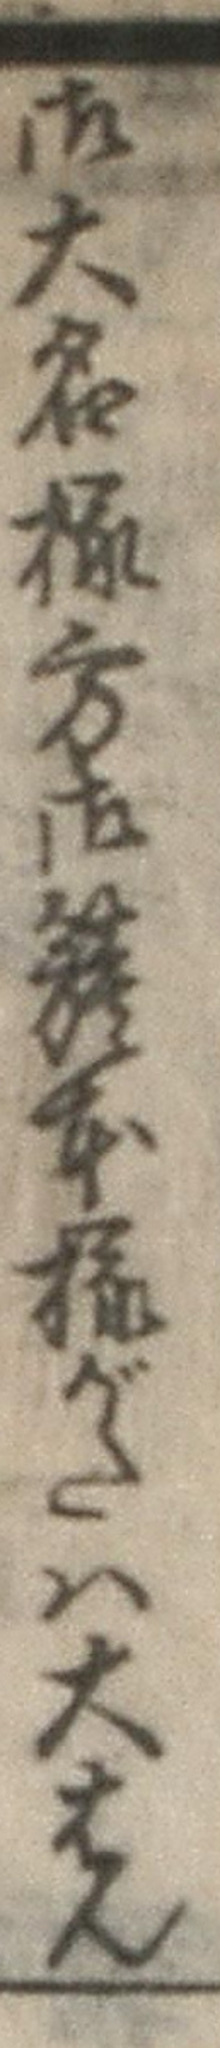御大名様方御旗本様がたは大はん
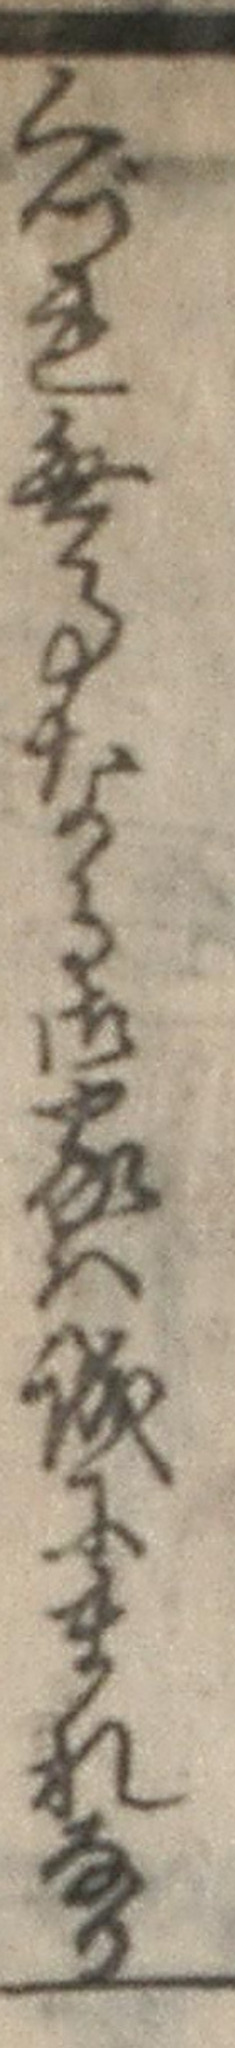くづれ無事なる御家は誠にまれなり
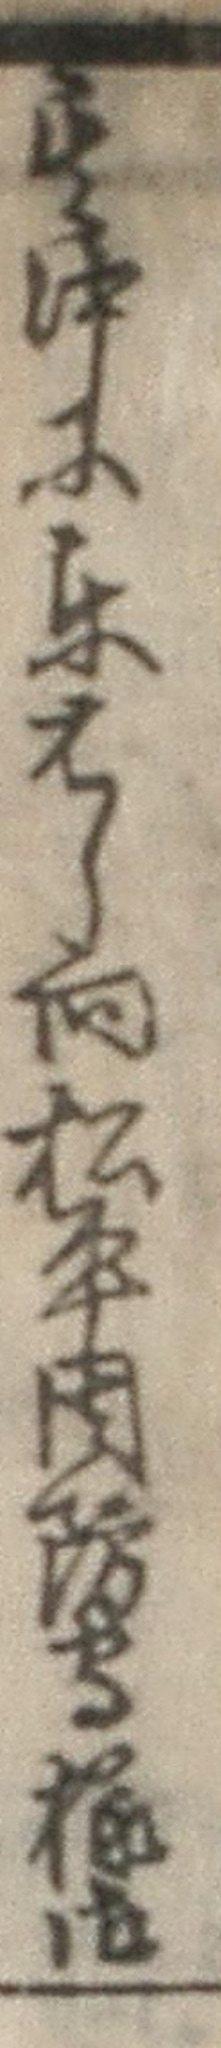其中に東はし向松平周防様御
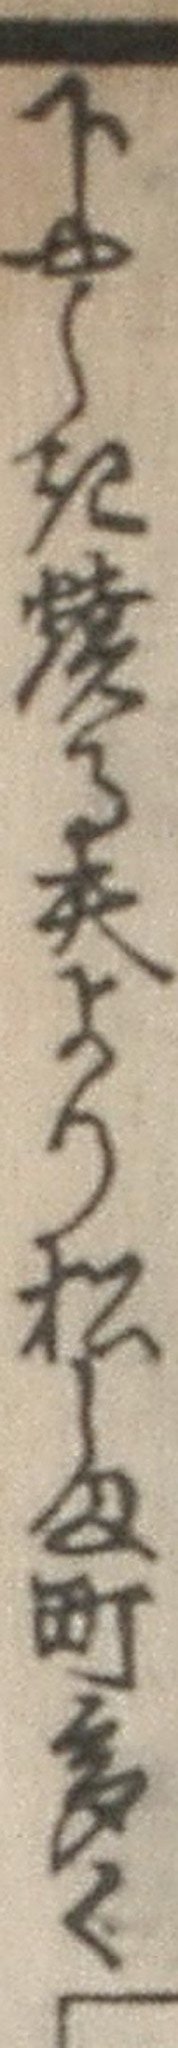下やしき焼る夫より松しま町多く
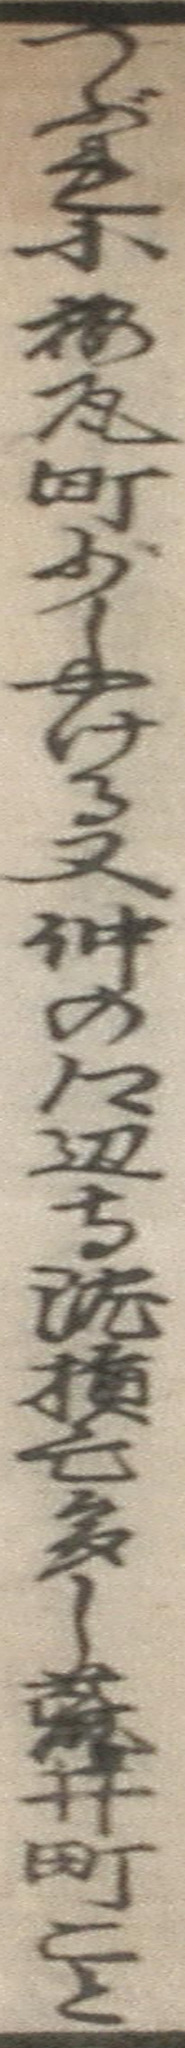つぶれ小梅瓦町少しやける又中の郷辺寺院損亡多し荒井町こと
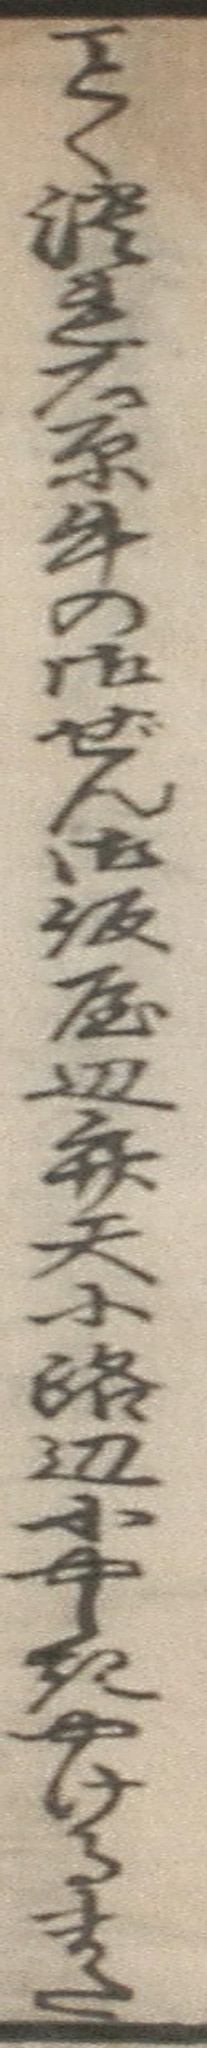ことく潰れ石原牛の御ぜん御仮屋辺弁天小路辺にやしきやけるまた
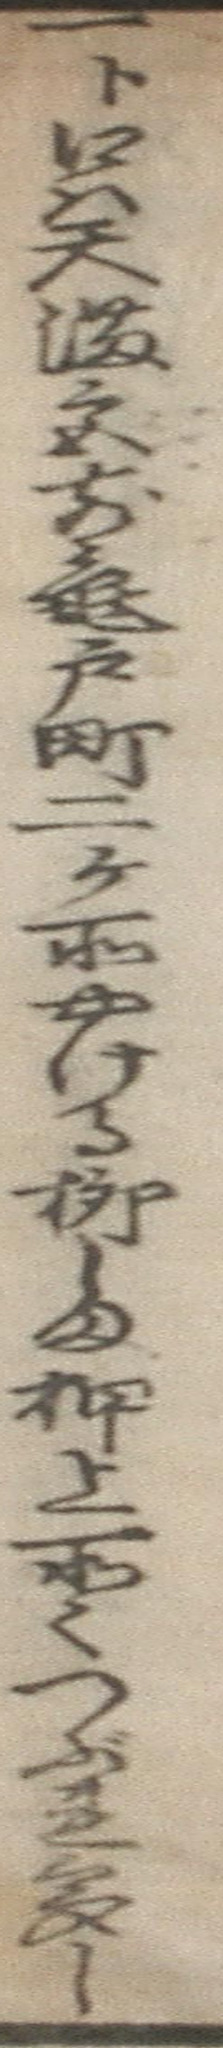一ト口は天満宮前亀戸町二ケ所やける柳しま押上所〻つぶれ多し
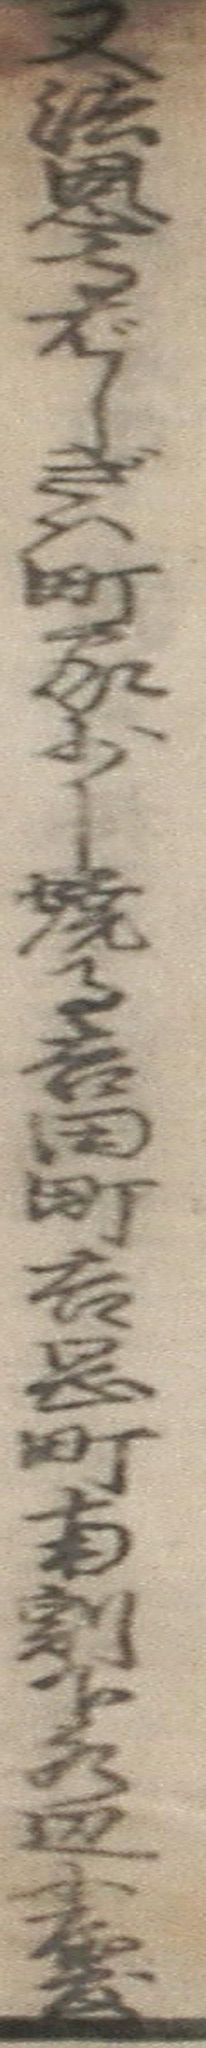又法恩寺ばしぎは町家少し焼る吉田町吉岡町南割下水辺小屋敷
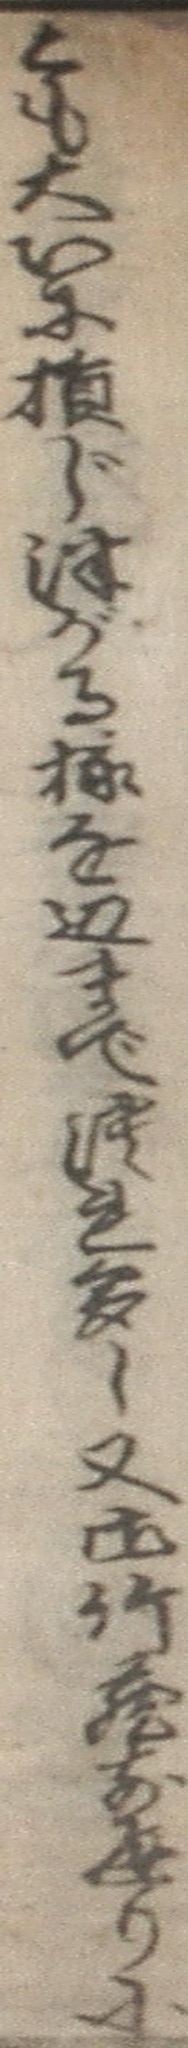とも大いに損じつがる様近辺まで潰れ多し又御竹蔵前通り小
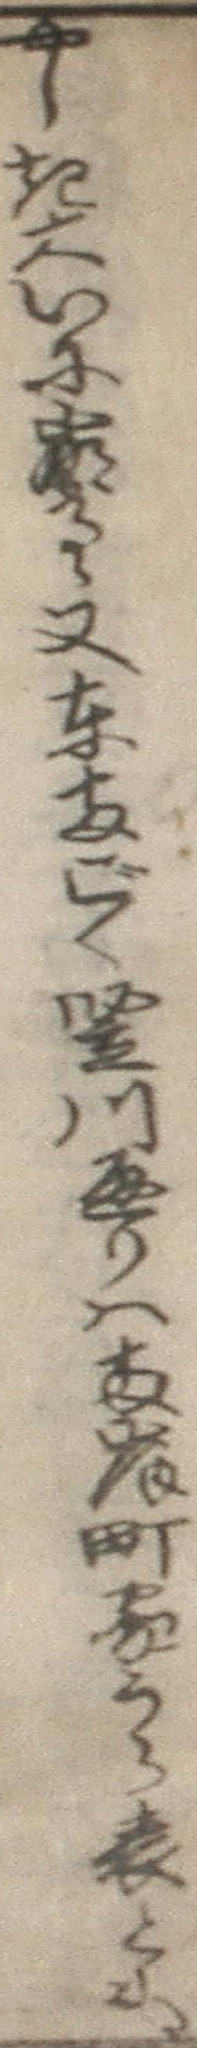やしき大いに崩るゝ又東両国竪川通りは両岸町家うら表とも
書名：江戸大地震末代鑑
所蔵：東京大学地震研究所図書室 Earthquake Research Institute Library, The University of Tokyo, JAPAN
